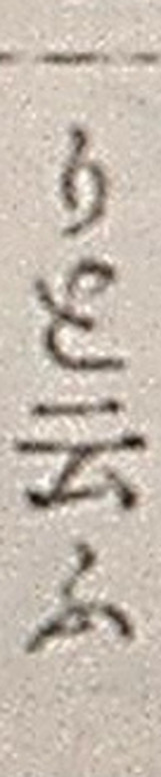りと云ふ
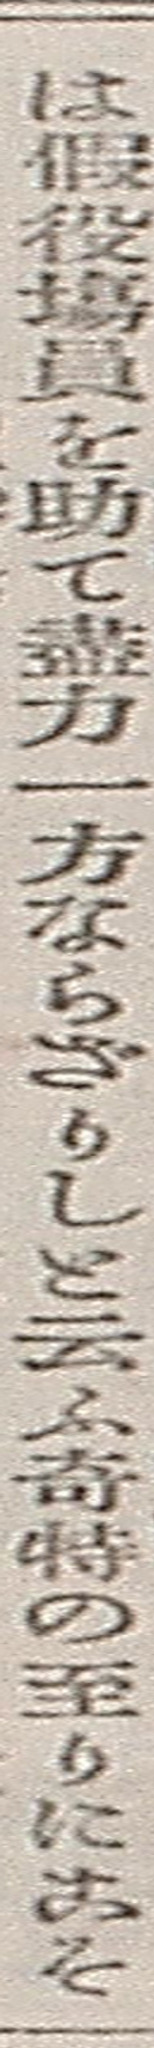は仮役場員を助て尽力一方ならざらりしと云ふ奇特の至りにこそ
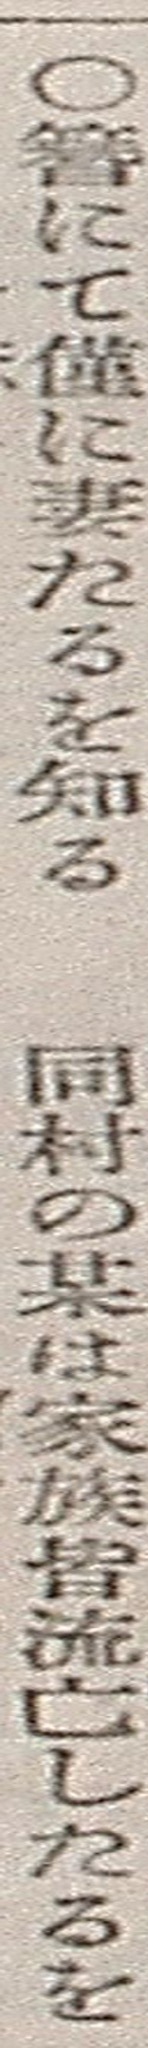○簪にて僅に妻たるを知る同村の某は家族皆流亡したるを
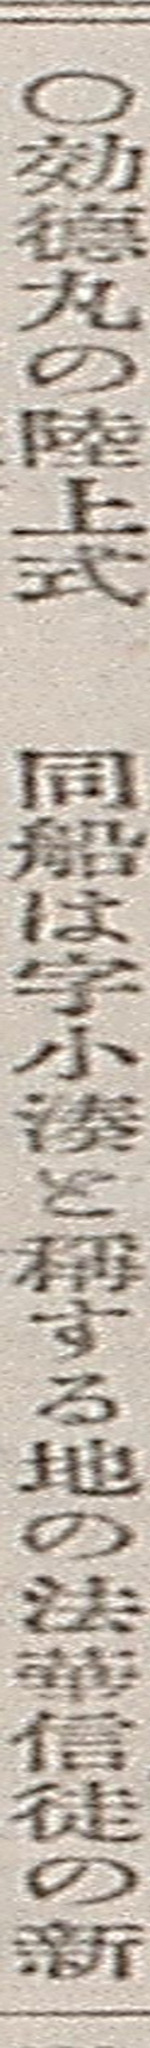○効徳丸の陸上式同船は字小湊と称する地の法華信徒の新
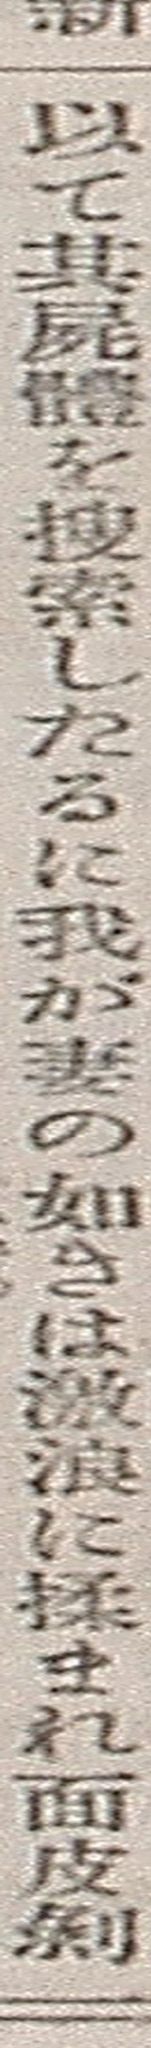以て其屍体を捜索したるに我が妻の如きは激浪に揉まれ面皮剥
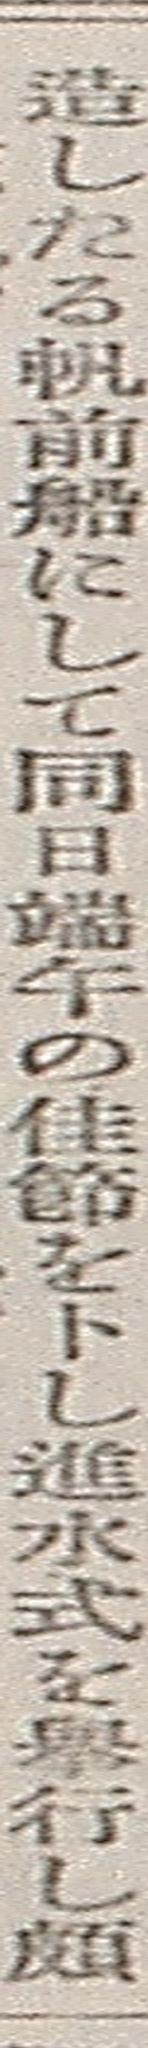造したる帆前船にして同日端午の佳節を卜し進水式を挙行し頗
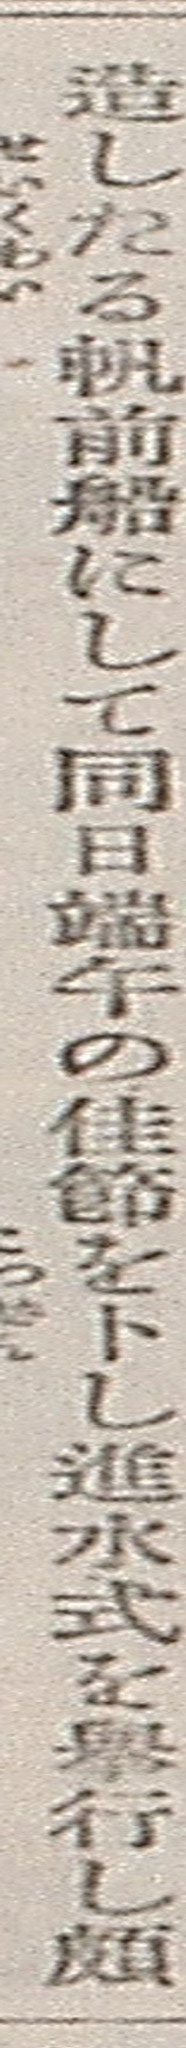造したる帆前船にして同日端午の佳節を卜し進水式を挙行し頗
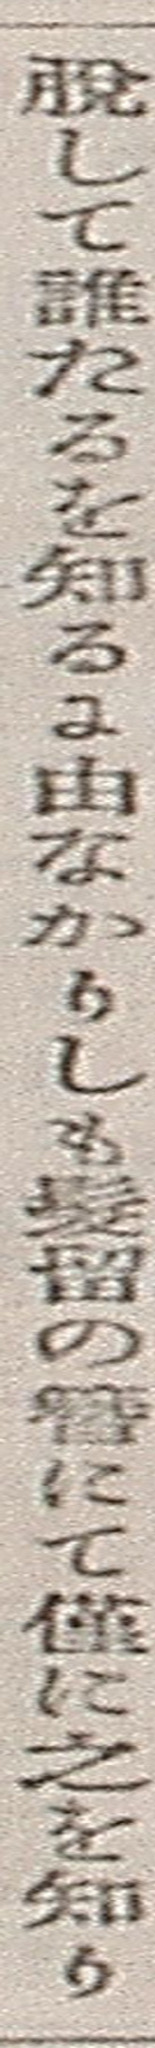脱して誰たるを知るに由なかりしも髪留の簪にて僅に之を知り
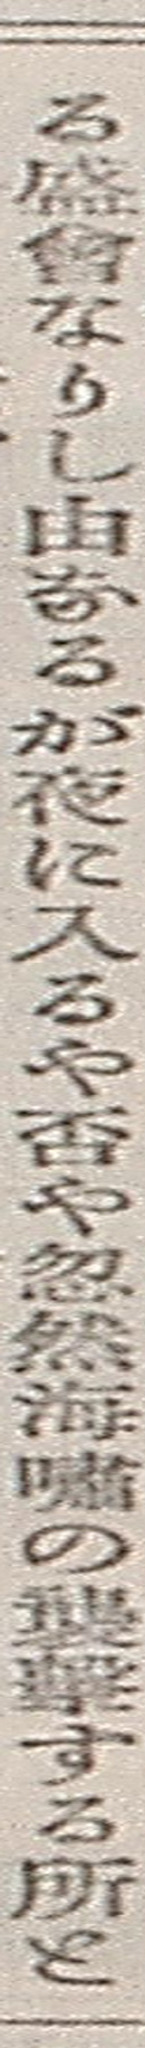る盛会なりし由なるが夜に入るや否や忽然海嘯の襲撃する所と
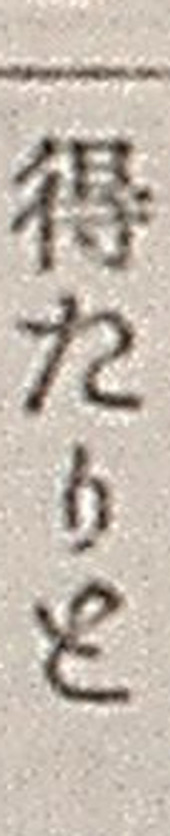得たりと
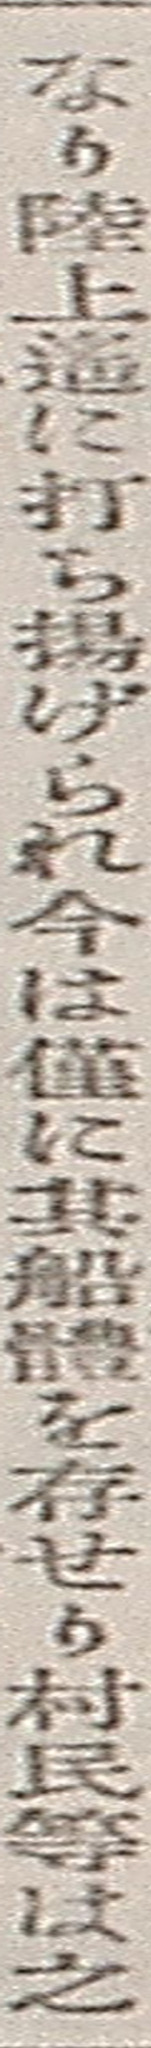なり陸上遙に打ち揚げられ今は僅に其船体を存せり村民等は之
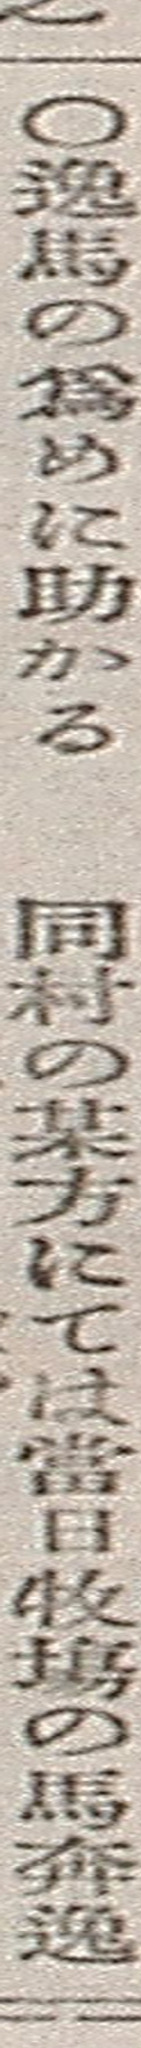○逸馬の為めに助かる同村の某方にては当日牧場の馬奔逸
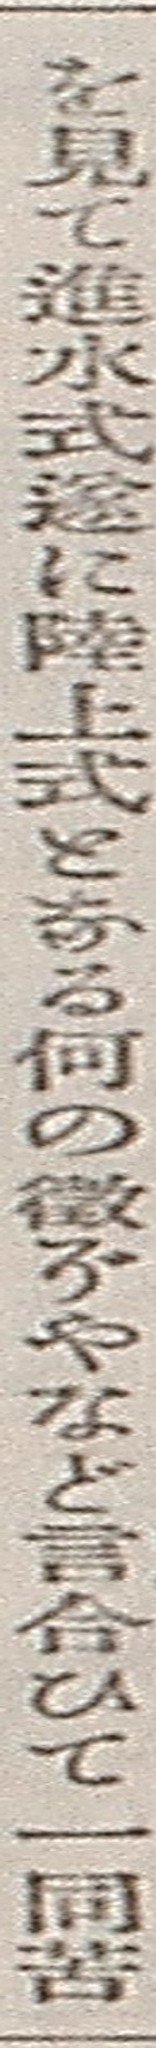を見て進水式遂に陸上式となる何の徴ぞやなど言合ひて一同苦
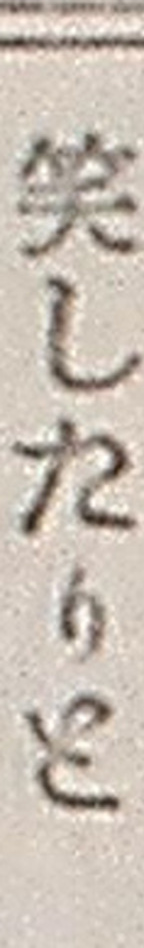笑したりと
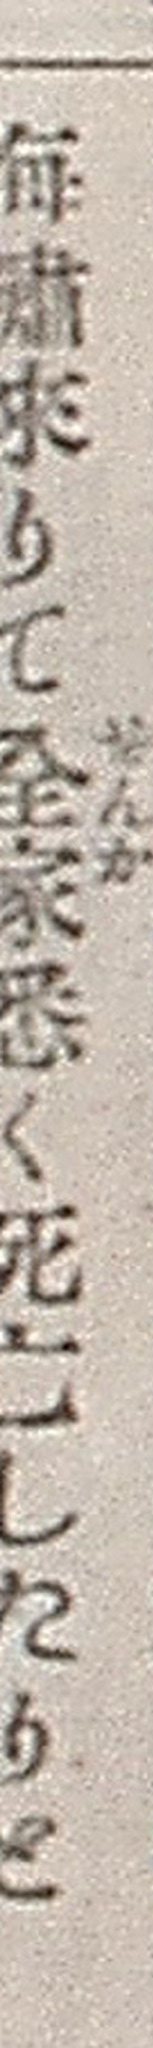海嘯来りて全家悉く死亡したりと
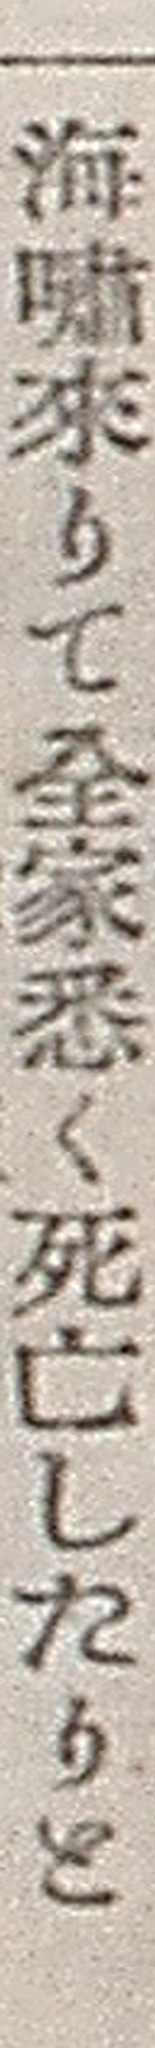海嘯来りて全家悉く死亡したりと
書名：風俗畫報臨時増刊第百十九號　大海嘯被害録（中）
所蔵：東京大学地震研究所図書室 Earthquake Research Institute Library, The University of Tokyo, JAPAN
